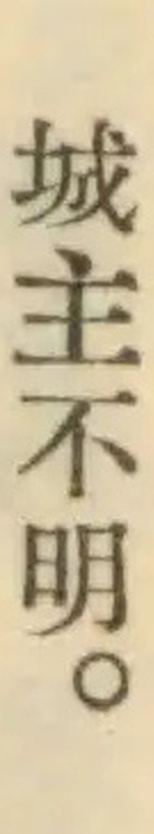城主不明。
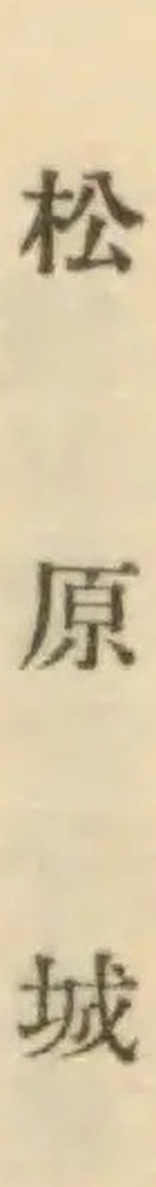松原城
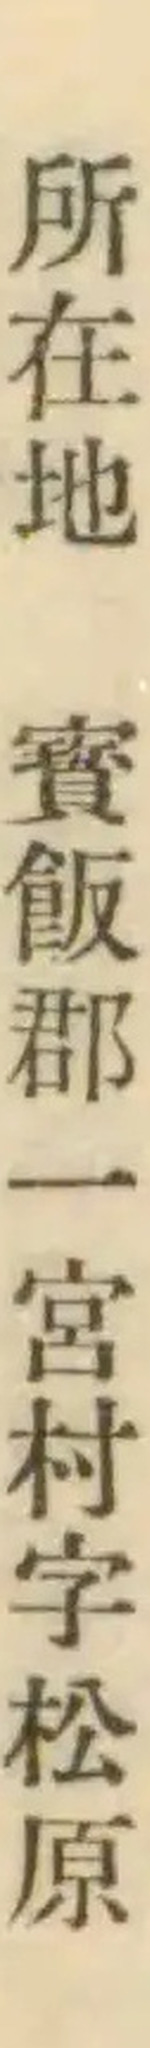所在地宝飯郡一宮村字松原
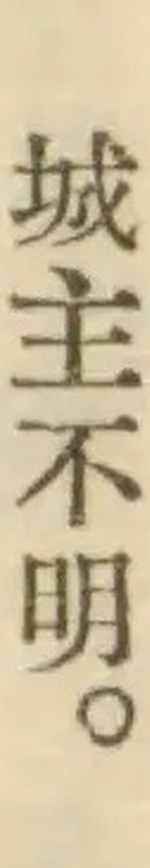城主不明。
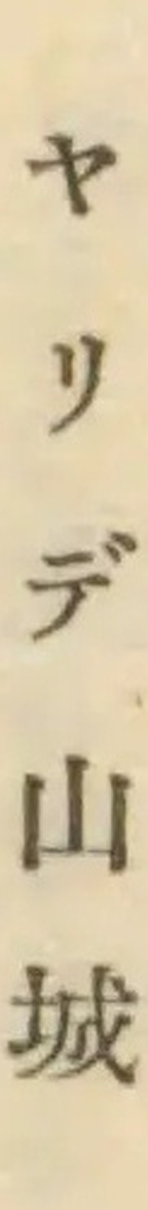ヤリデ山城
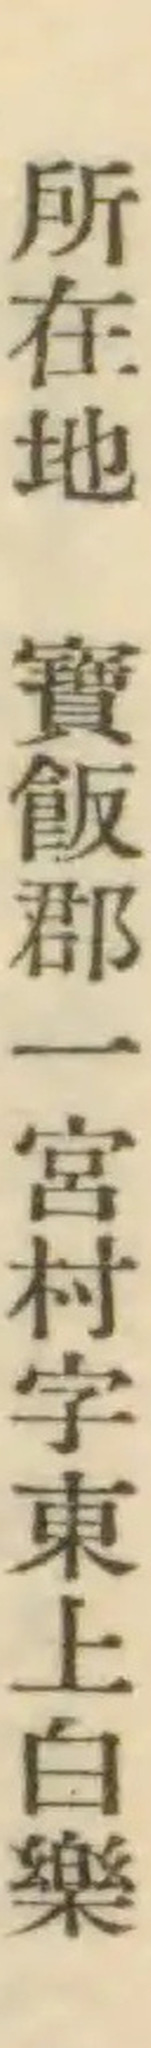所在地宝飯郡一宮村字東上白楽
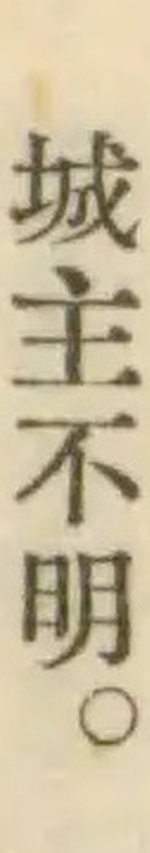城主不明。
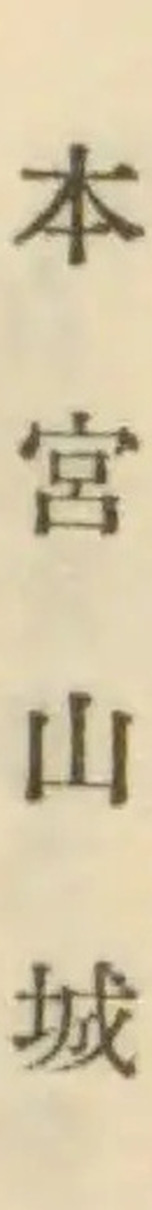本宮山城
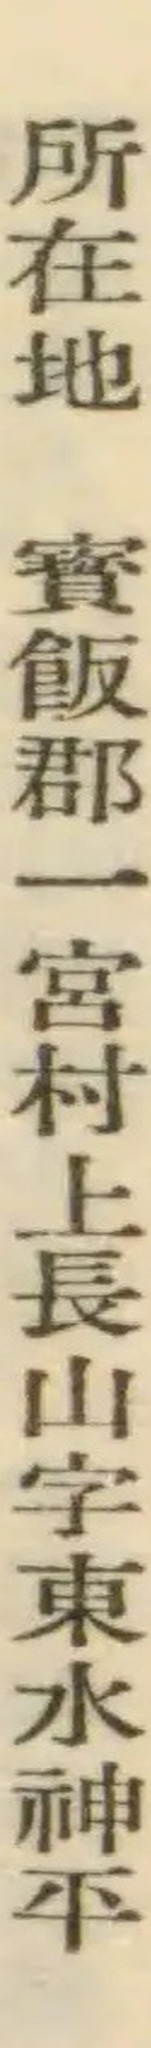所在地宝飯郡一宮村上長山字東水神平
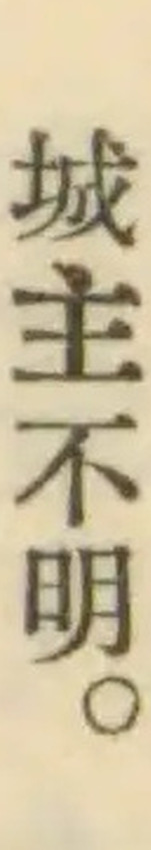城主不明。
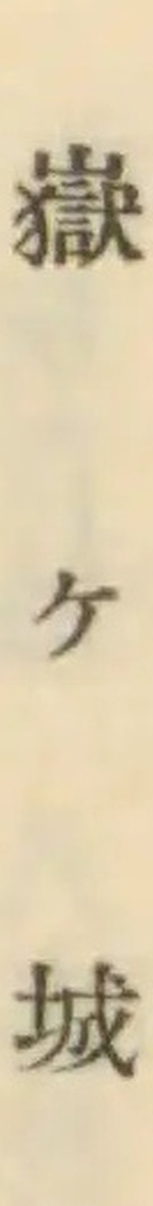嶽ケ城
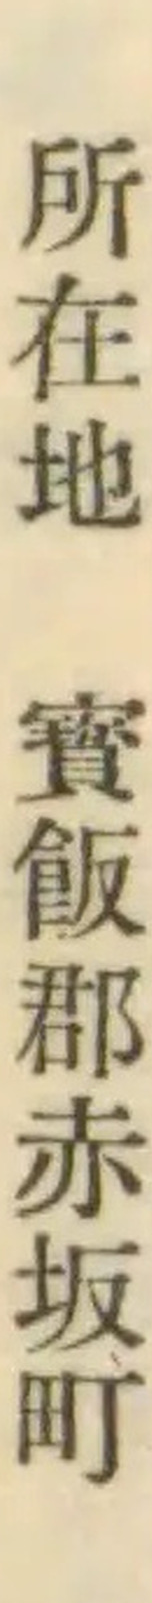所在地宝飯郡赤坂町
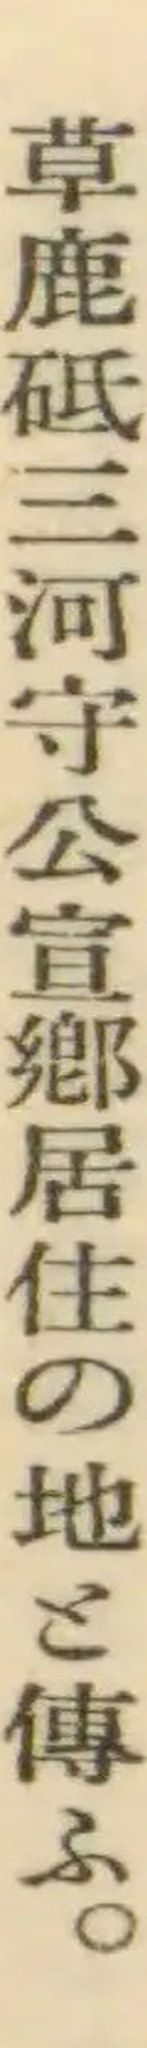草鹿砥三河守公宣郷居住の地と伝ふ。
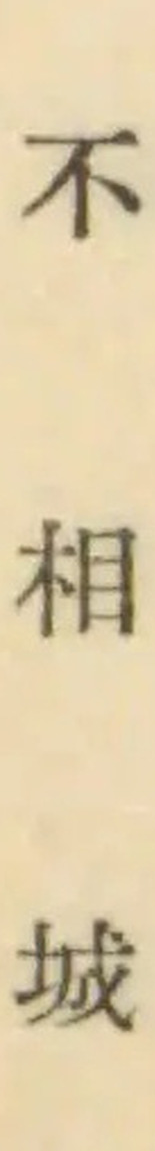不相城
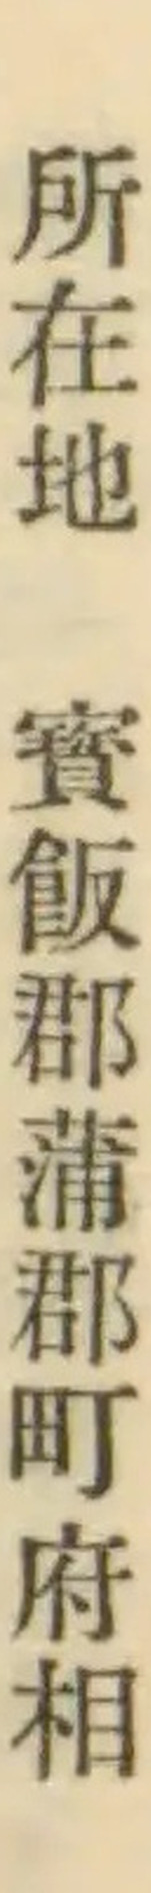所在地宝飯郡蒲郡町府相

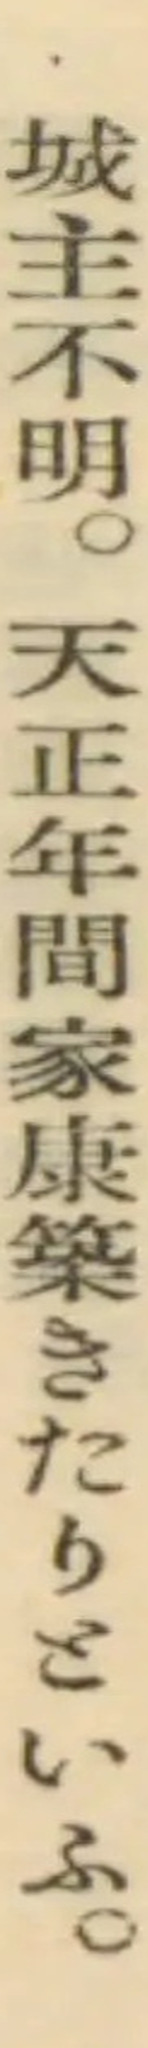城主不明。天正年間家康築きたりといふ。
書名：東三河之古城
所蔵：国立国会図書館 National Diet Library, JAPAN
